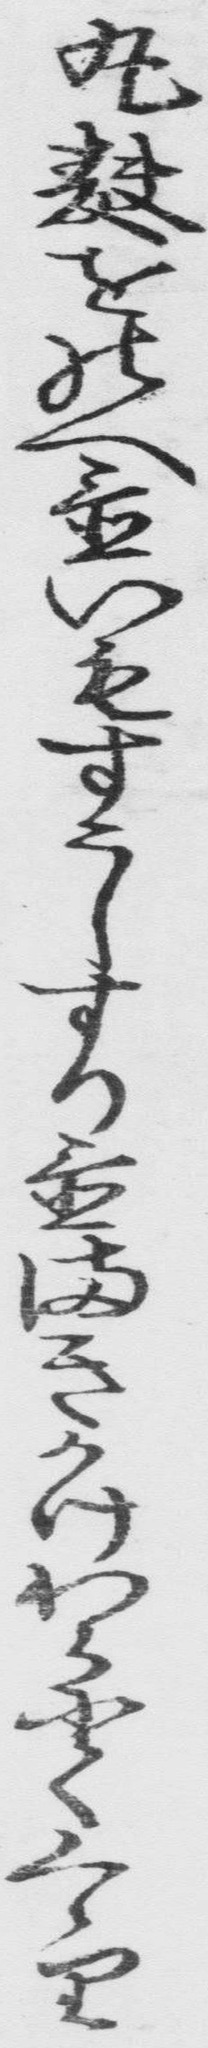丸麩を能へ置いもすこしすり置満きかけわら尓てくゝ里
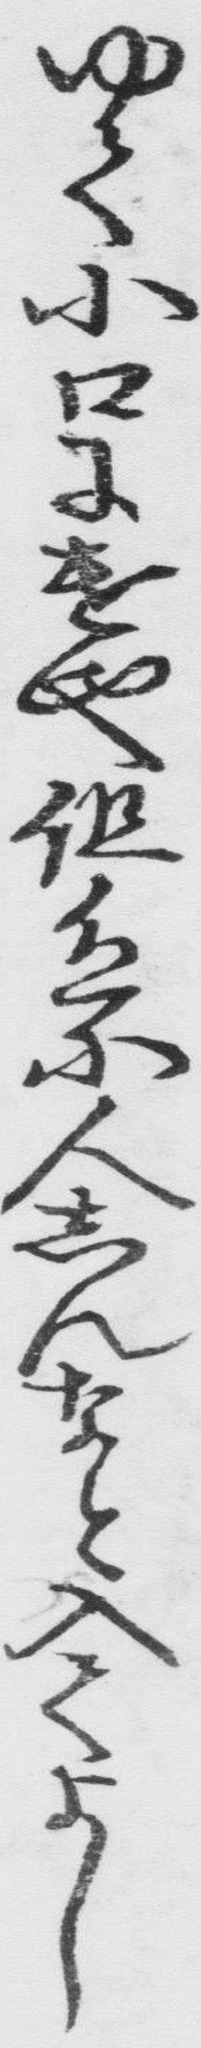ゆて小口尓遣也但色小人志んなと入てよし
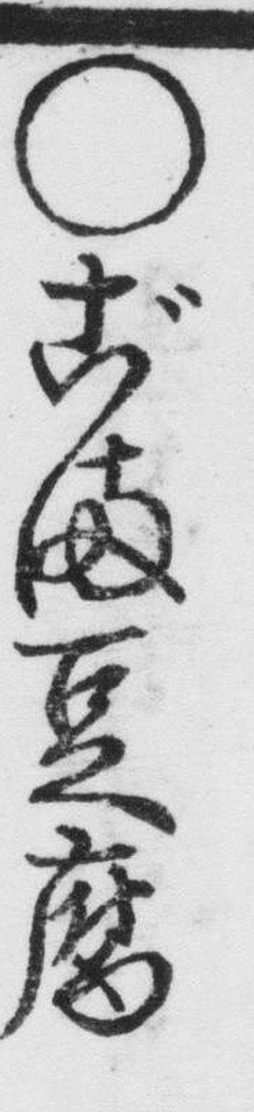〇ご満豆腐
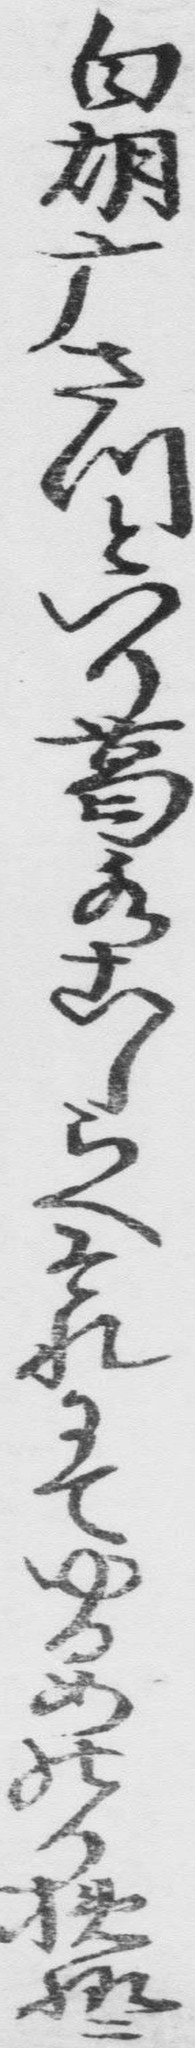白胡麻さ川といり葛水古しらへそれ尓てゆるめ能り模様に
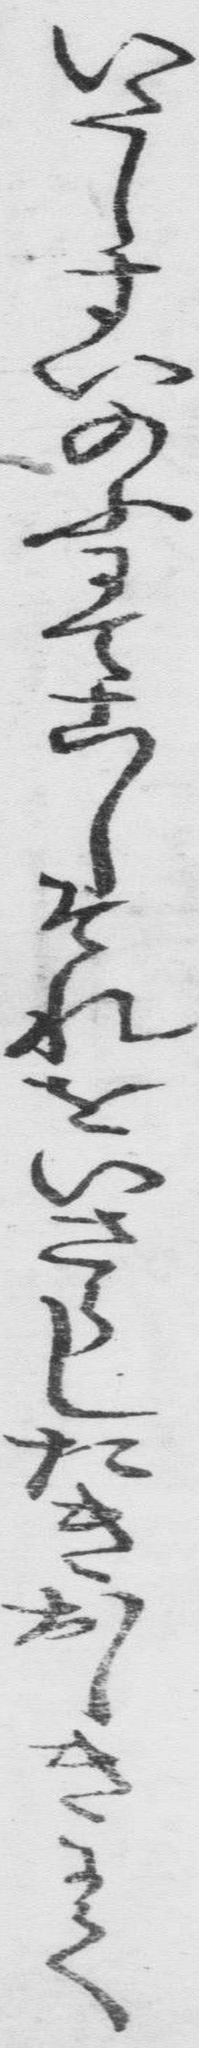いたしすいのふ尓て古しそれをいさらしたきおしき尓て

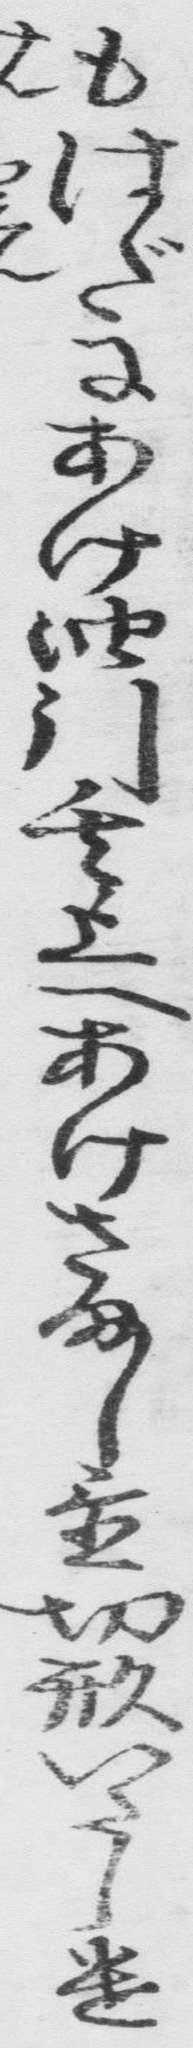もはだ尓あけ油引其上へあけさまし置切形いたし遣
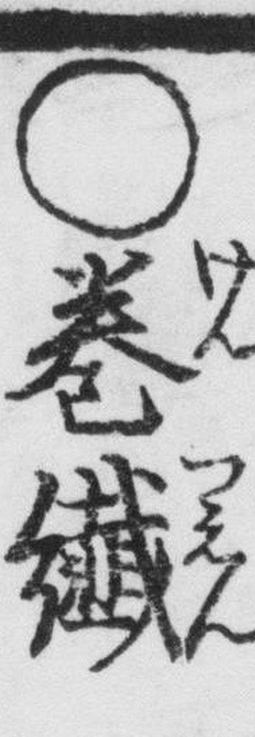〇巻繊
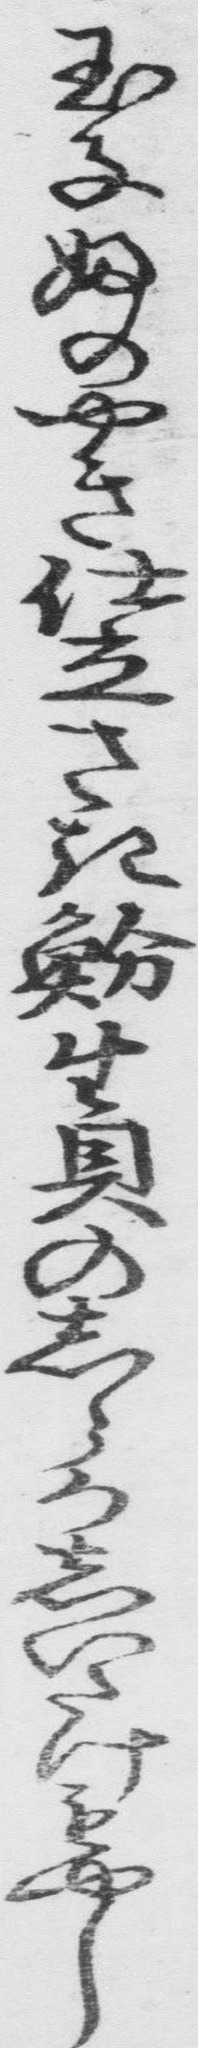玉子婦のやき仕立さ起魵生貝の志うか志いたけもやし
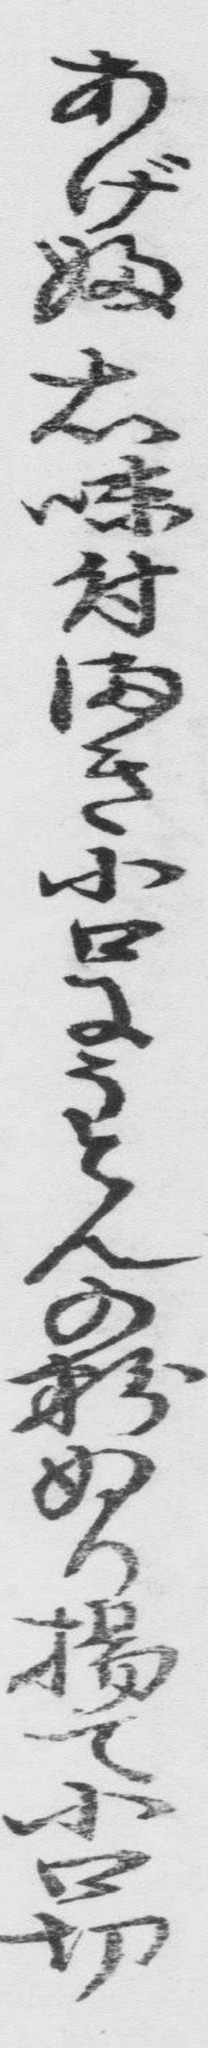あげ婦右味付満き小口尓うとんの粉ぬり揚て小口切
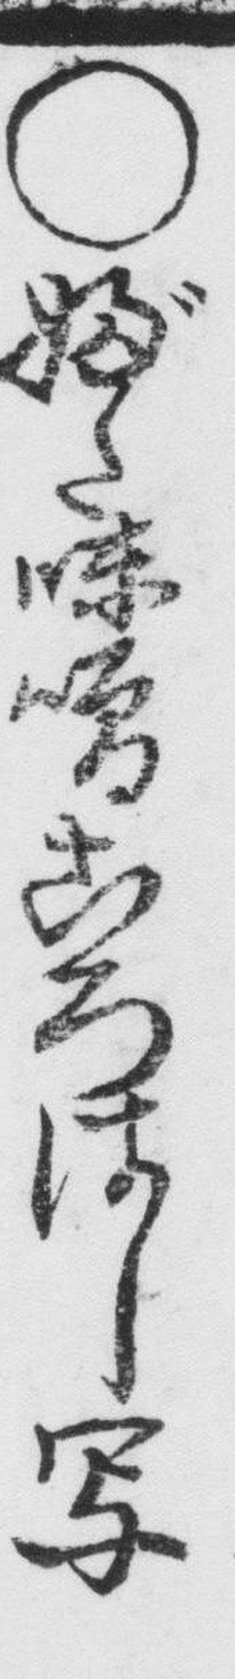〇ぶた味噌古ろはし写
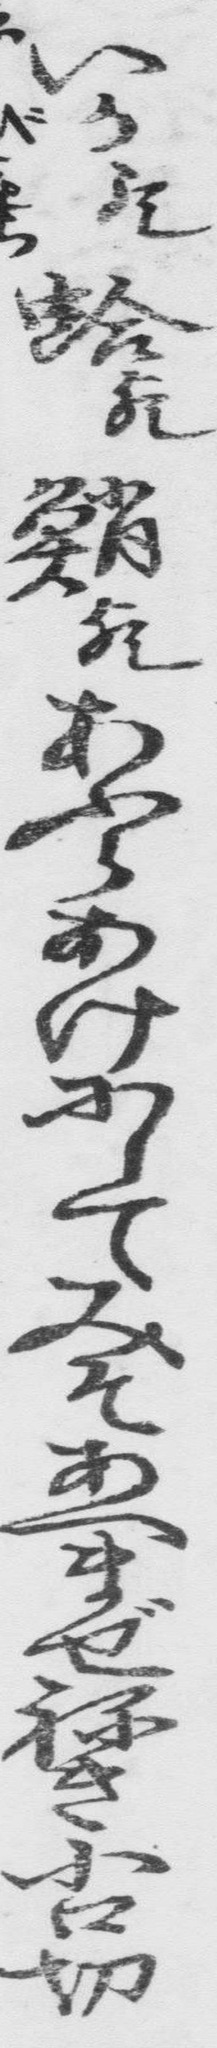いか歟蛤歟鮹歟あふらあけ尓してみそあへまぜ祢き小口切
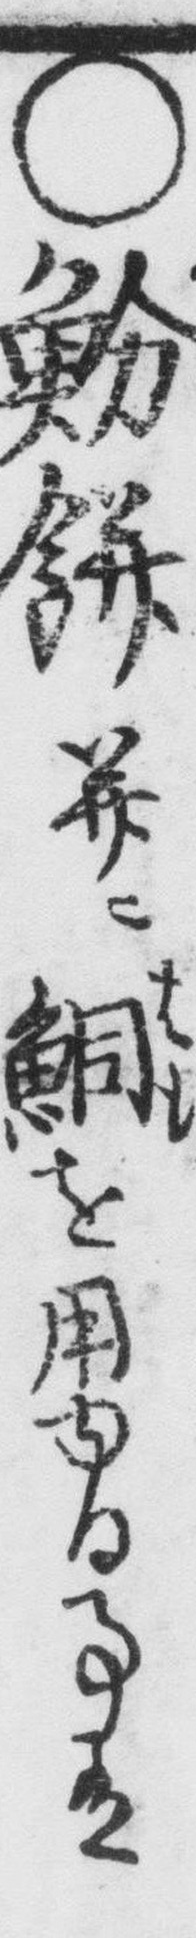〇魵餅幷に鮦を用ゆる事有
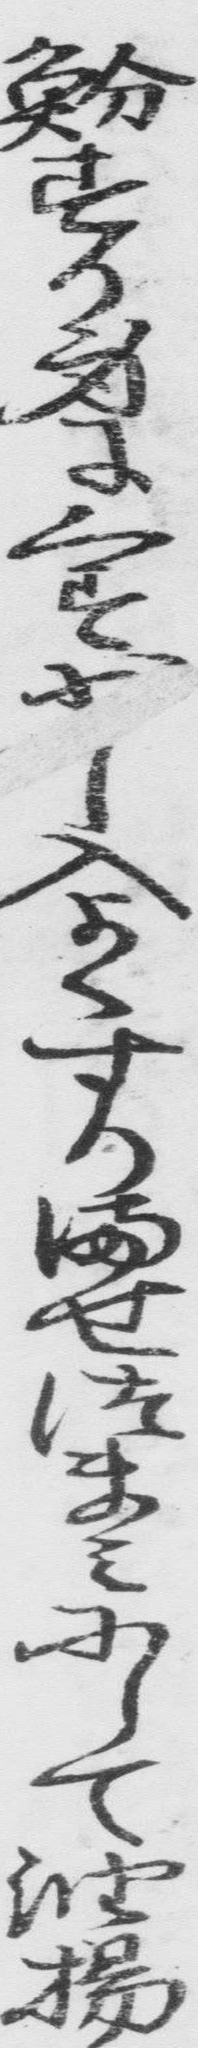魵春り身尓く春少し入よくすり満せ徒まみ尓して油揚
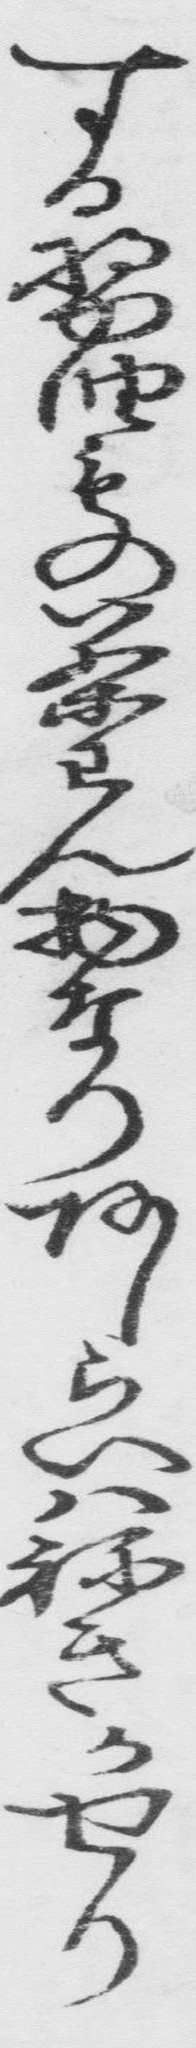する醤油もの茶わん物なり阿しらいは祢きかせり
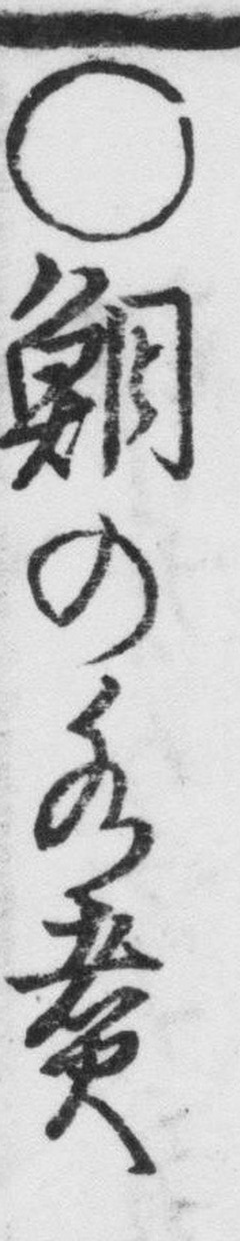〇鯛の水煮
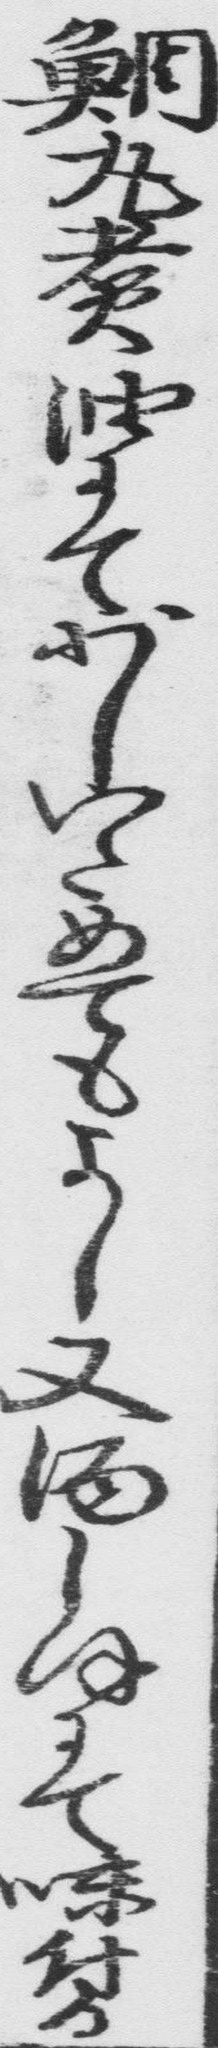鯛丸煮油尓て少しいためてもよし又酒しほ尓て味付か
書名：普茶料理抄
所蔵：大阪府立大学学術情報センター 国文学研究資料館
